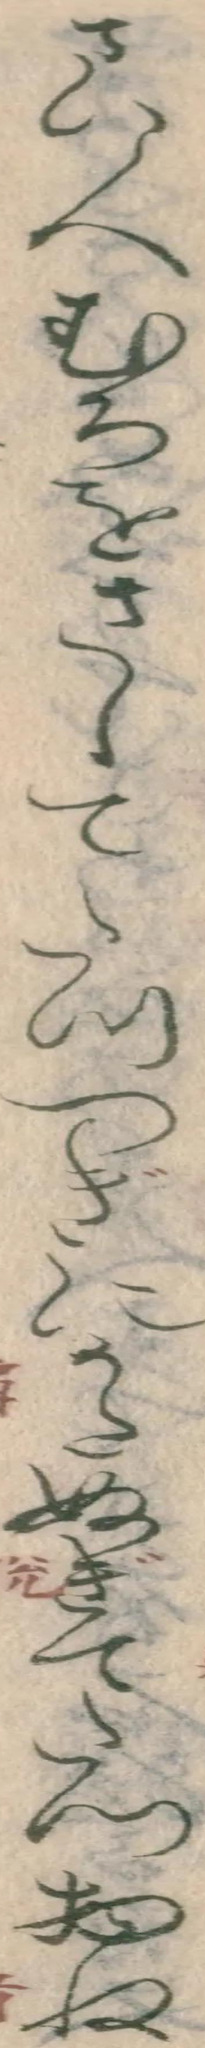まい人むろをさしてたつつぎにかたぬぎてたつ物ね
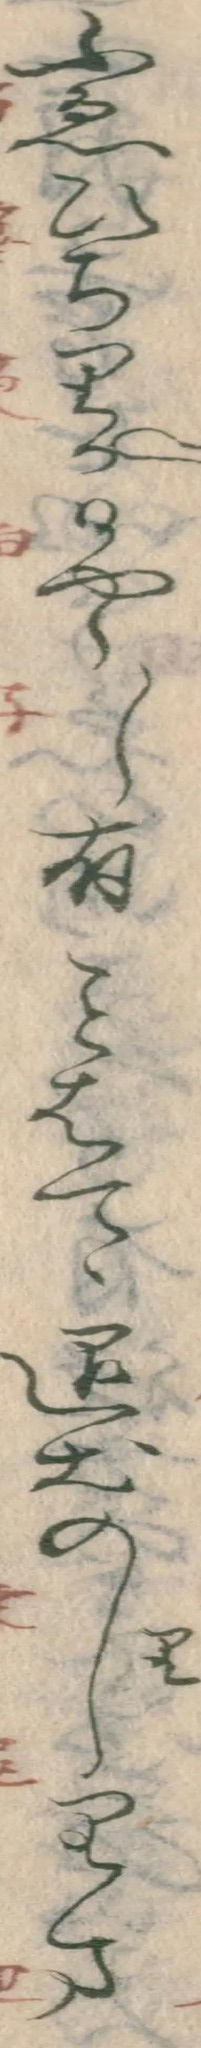ふゑひちりかひやうし有ことはてゝ退出のりしりま
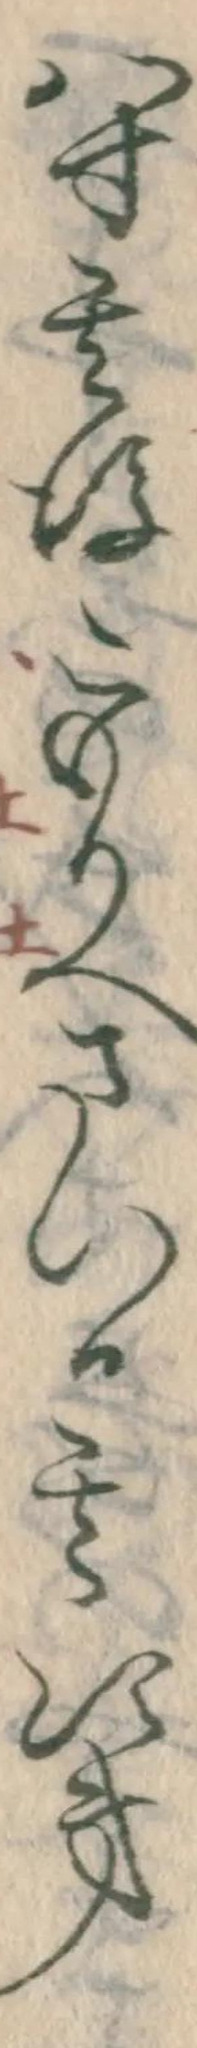はす其後こもりへまいる其次第
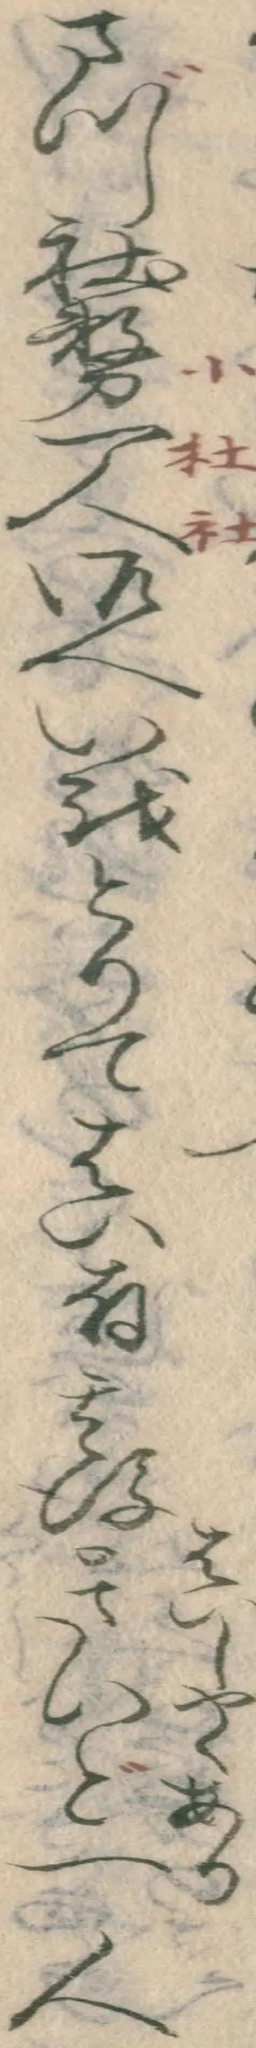まづ社務一人御へいをとりてはい有其後◦まいど一人
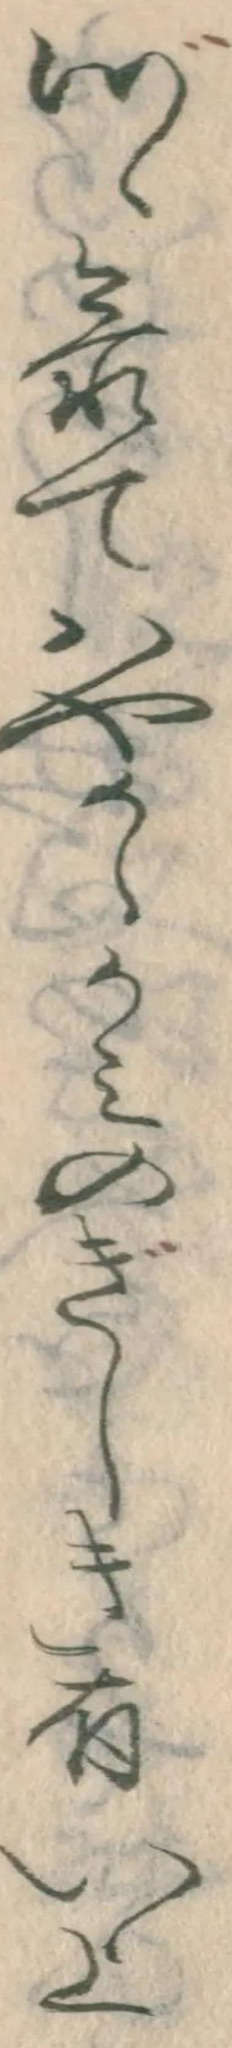づゝ参てはやからかみのぎしき有い上
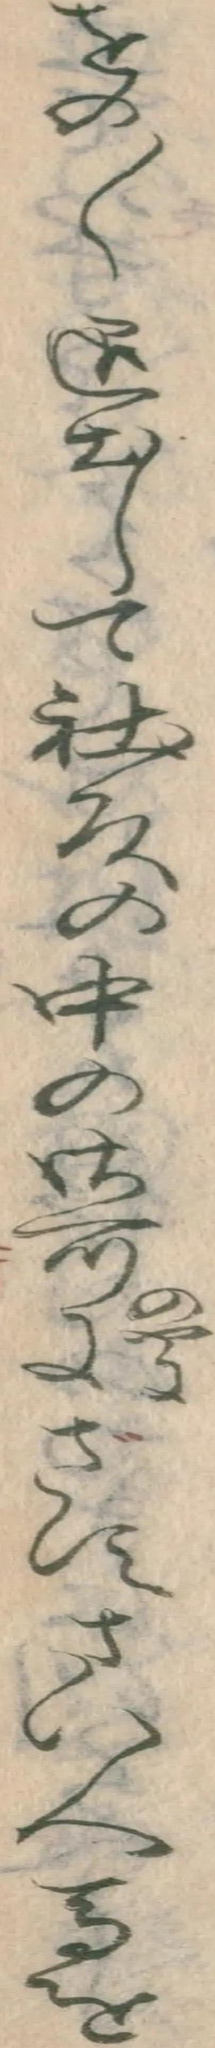をの〳〵退出して社頭の中の御所にざすまい人馬を

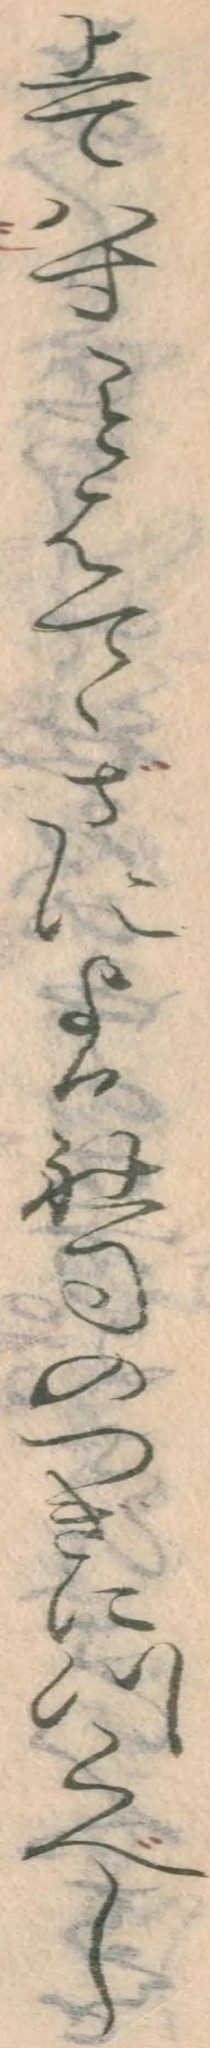上てはすことはてゝざによる社司のつぎにつくべし
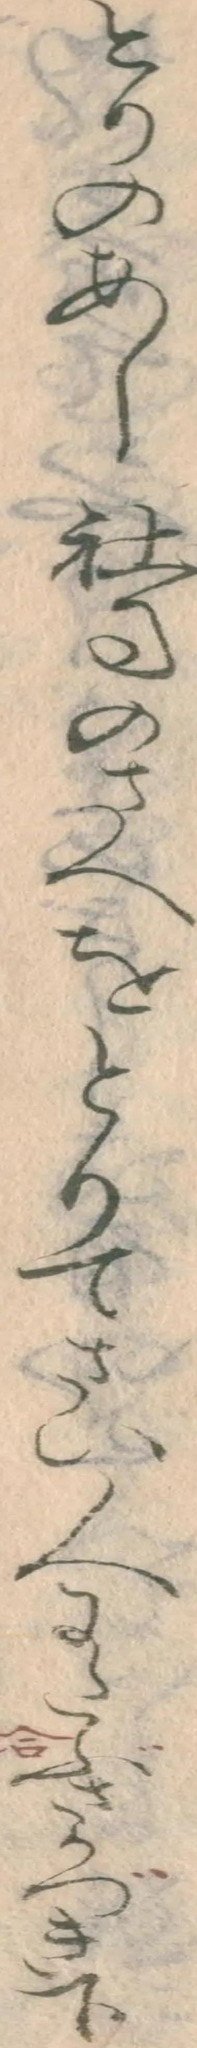とりのあし社司のまへをとりてまい人にたぶさかづき下
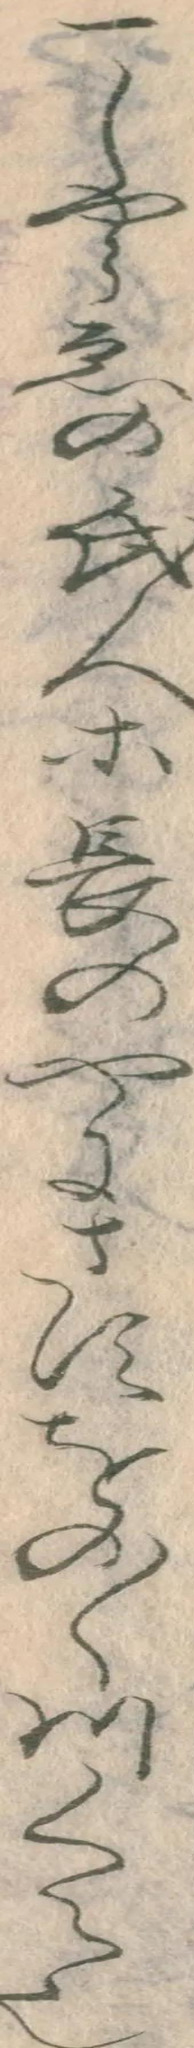一しやうゑの氏人等長のやにさすをの〳〵つくえ也
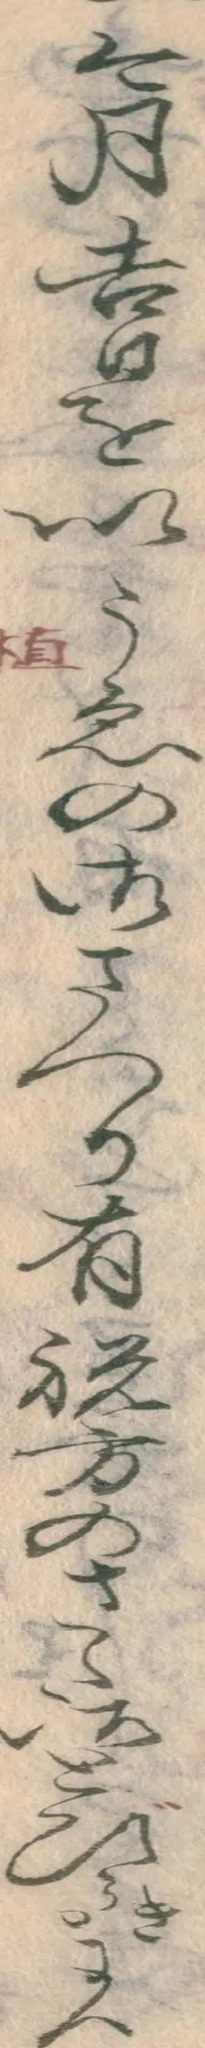一今月吉日を以うゑの御まつり有祝方のさた御とびら◦には
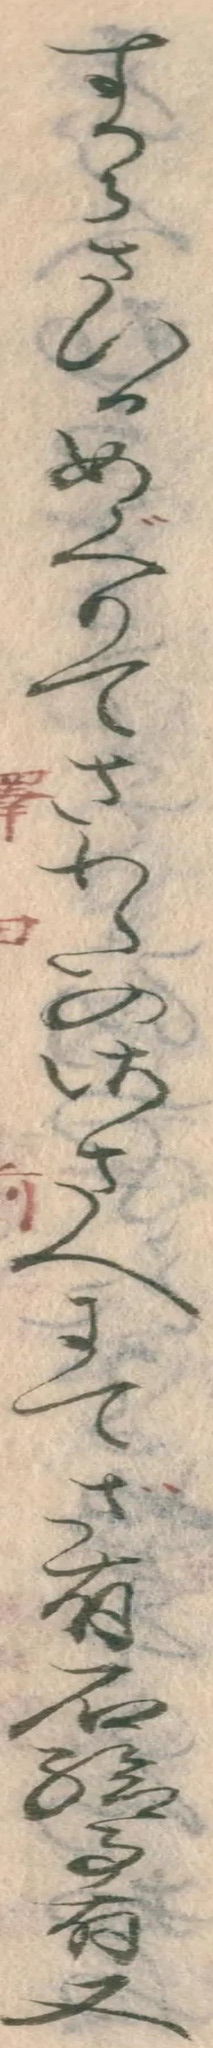すかうまいるめぐりてさわたの御まへにてざ有石給事有又
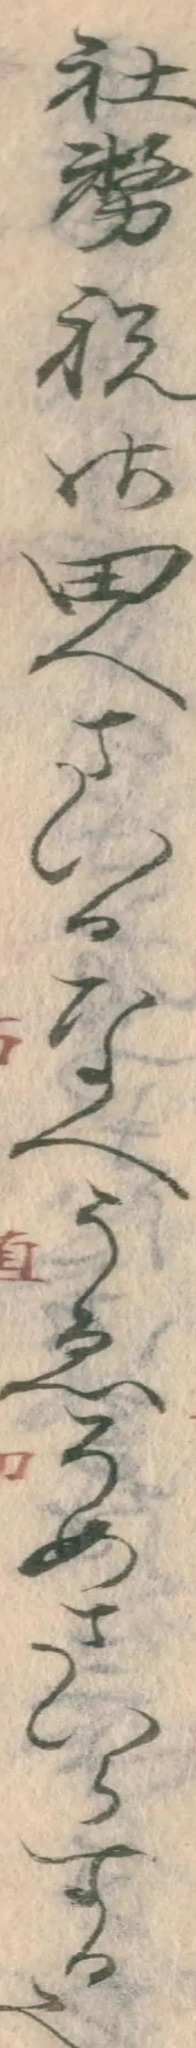社務祝御田へまいるなへうゑそめまいらする也
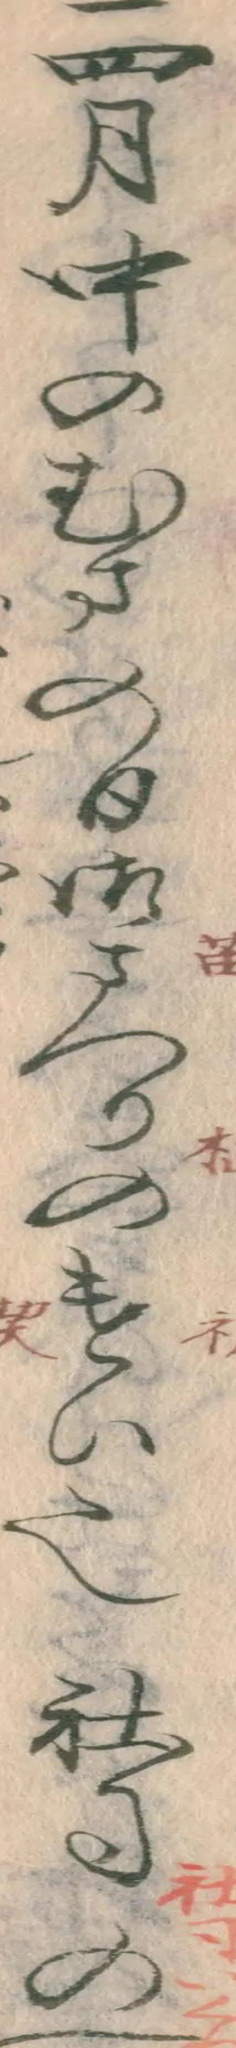一四月中のむまの日御まつりのけひ也社司の
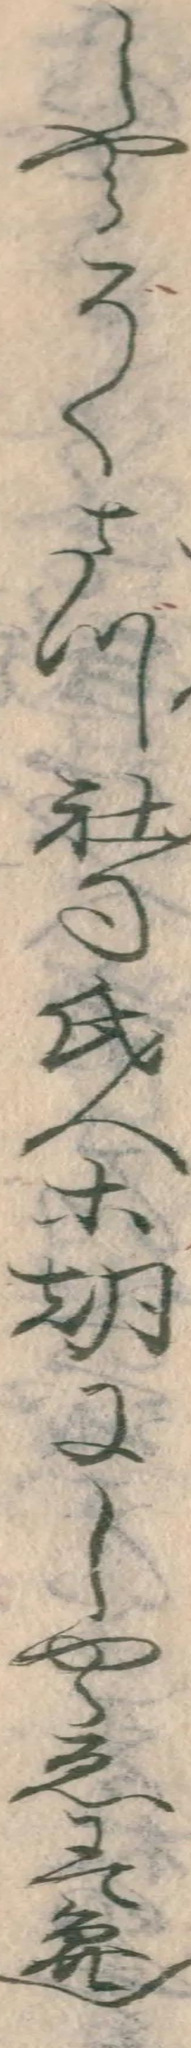しやうぞくまづ社司氏人等朝にしやうゑにて参
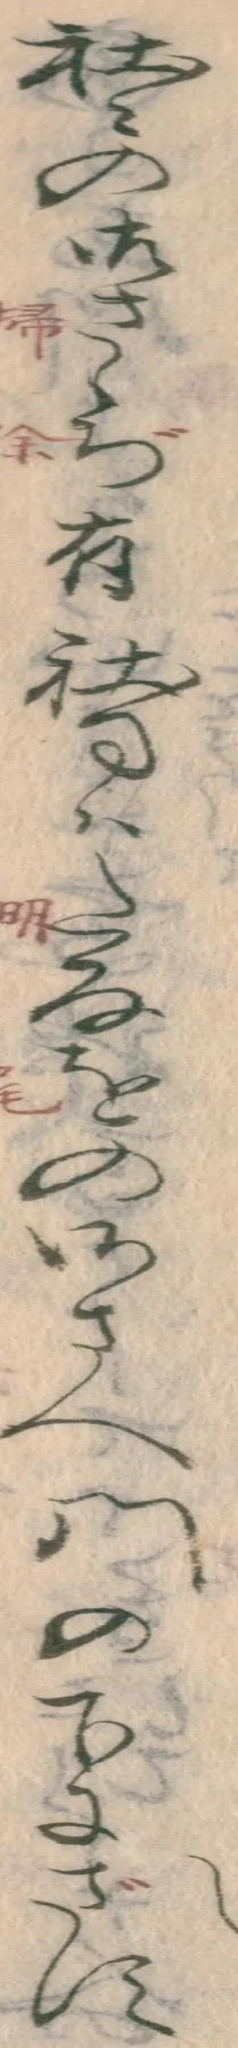社々の御さうぢ有社司はたなをの御まへ門の下にざす
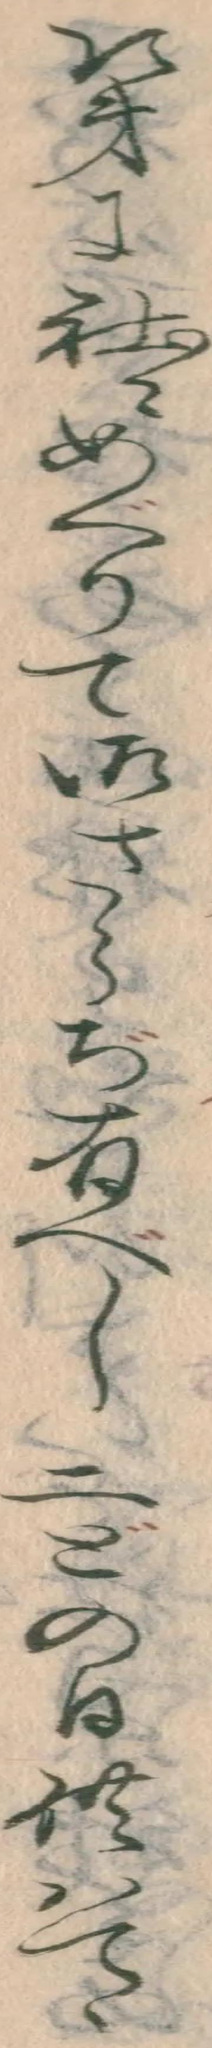次第に社々めぐりて御さうぢ有べし二どの日供はてゝ
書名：賀茂社記録. 第3冊
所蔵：国立国会図書館 National Diet Library, JAPAN
